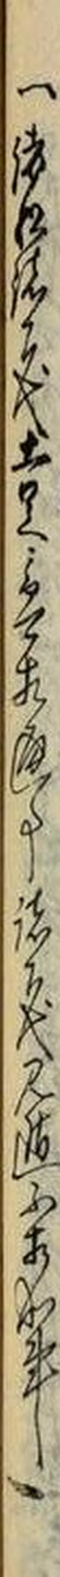一諸組諸下代土足に而可相通候事諸下代見遁不相成事
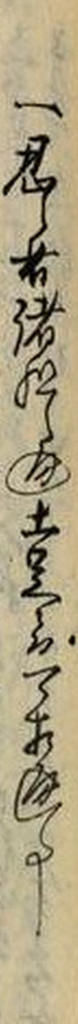一忍之者諸組之通土足に而可相通候事
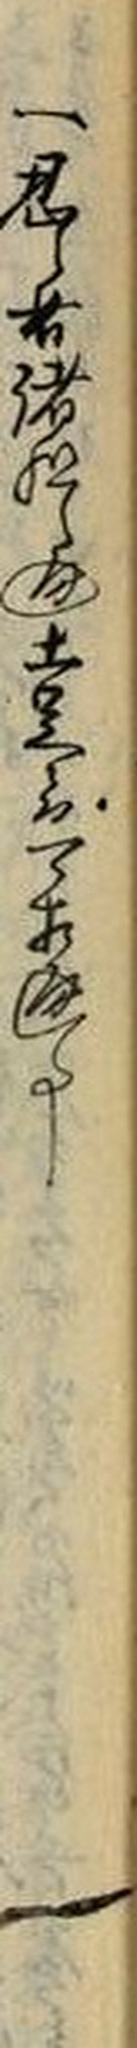一忍之者諸組之通土足に而可相通候事
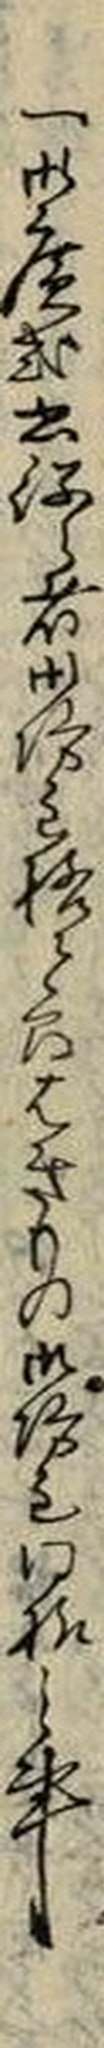一御広敷書役之者御坊主格に候間はきもの御坊主同様之事
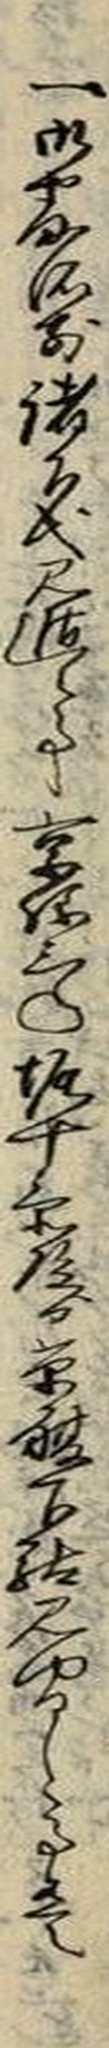一御番所前諸下代見遁候事享保三年堀十兵衛殿ゟ草履下駄見ゆるし候事有之
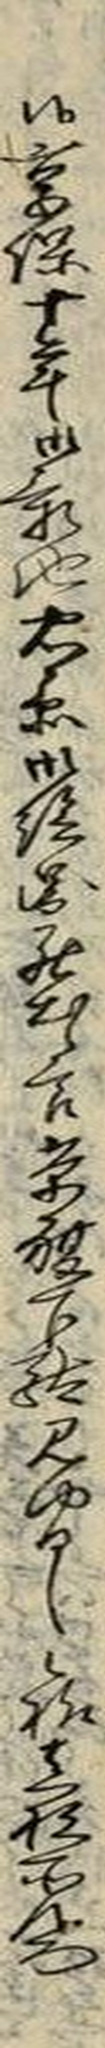候享保十年御新池忠兵衛御絵図罷出候節草履下駄見ゆるし候様真柄所左衛門
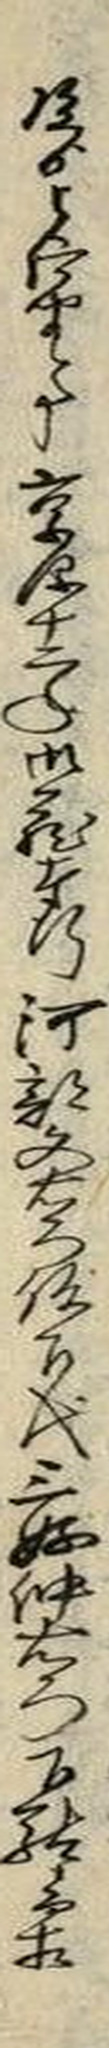殿ゟ被仰聞候事享保十二年御蔵奉行河部又右衛門殿下代三好仲右衛門下駄に而相
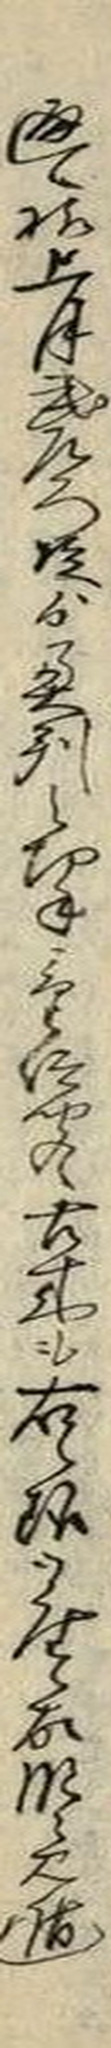通候様上月武左衛門殿ゟ奥判之切手に而被仰聞候古来も右之趣御座候故段々見遁
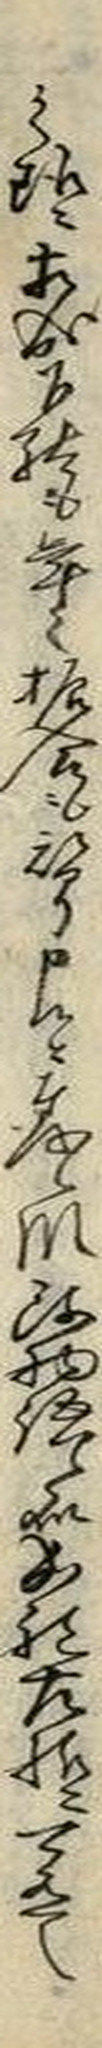之趣に相成下駄も年々振合も替り申候と奉存候段致物語候処成程左様に可有之
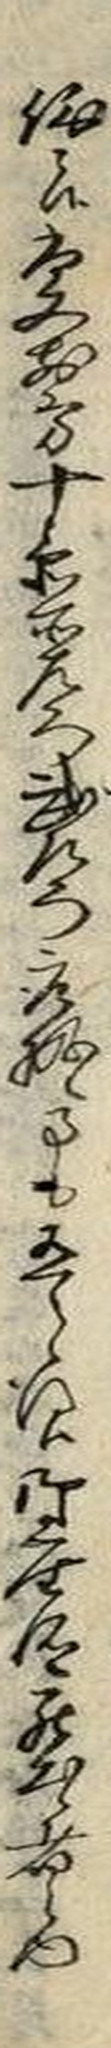儀に候尚又前方十兵衛所左衛門武左衛門取扱候事も有之候得は御座所へ罷出候者之内
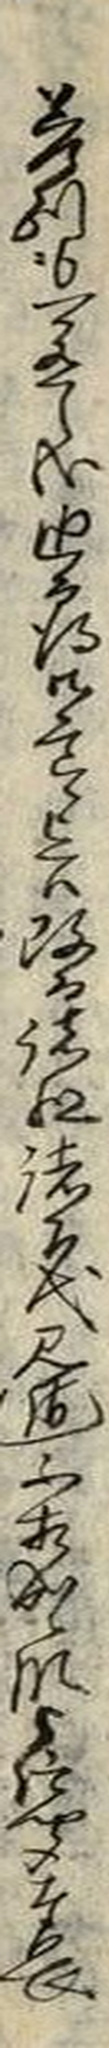差別も可有之哉追而得御意候迄は改而諸組諸下代見遁不相成候段被申聞奉畏
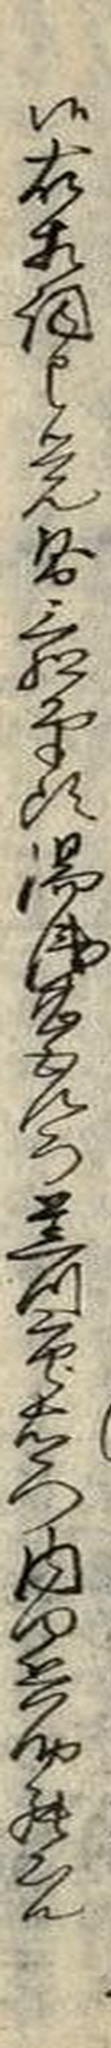候右相伺申候覚則三組筆頭湯浅甚五左衛門荒川市郎右衛門内田兵助罷出ル
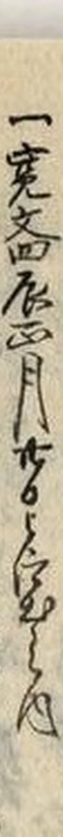一寛文四辰正月廿日被仰出候之内
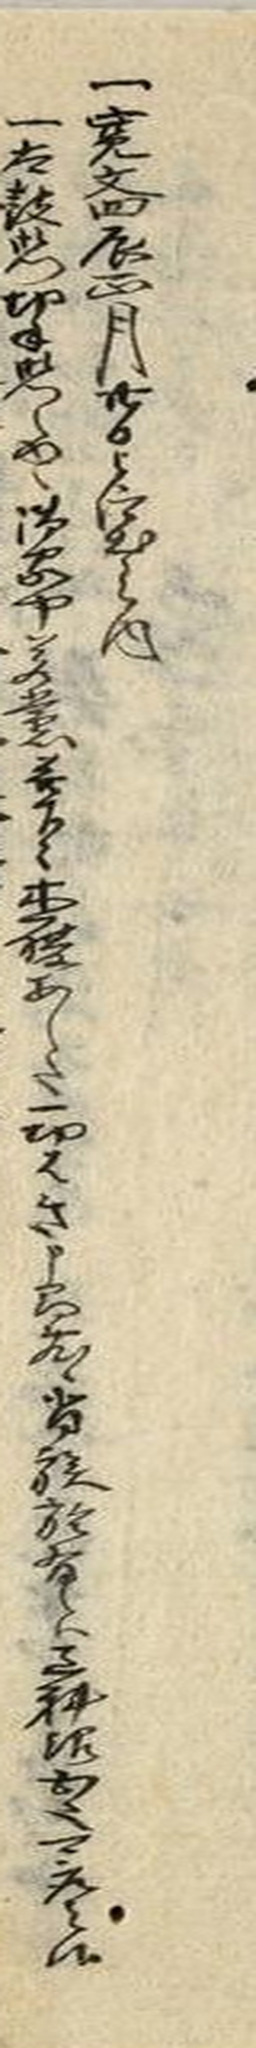一太鼓御門切手御門之内へ御家老中若党并下々木履あした一切はき不申間敷候背族於有之候は過料銀五匁可取之候
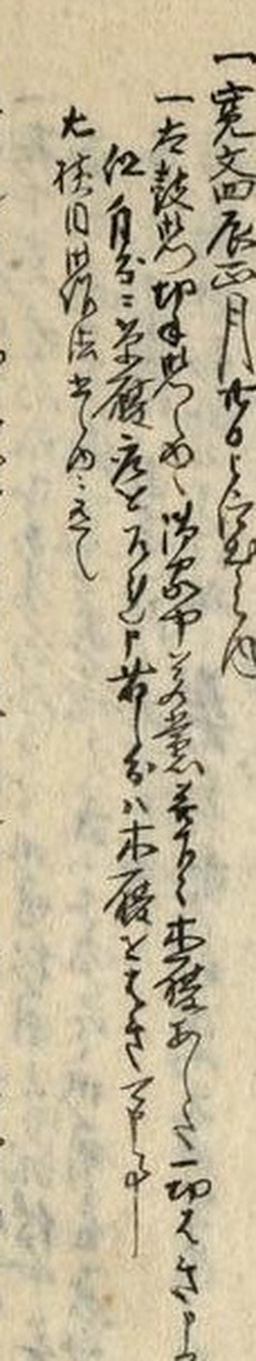但自分に草履取を召連申者之分は木履をはき可申事
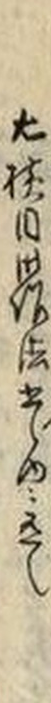右横目御作法書之内に有之
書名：御門御櫓之部
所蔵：福井県文書館 Fukui Prefectural Archives
